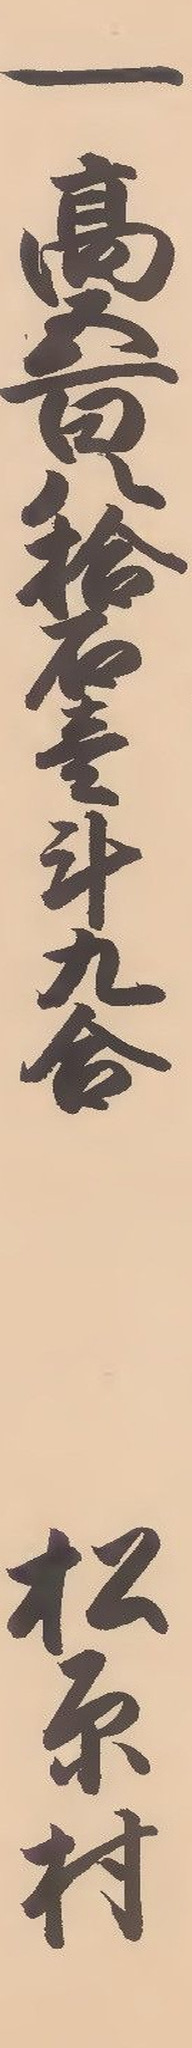一髙五百八拾石壱斗九合松原村

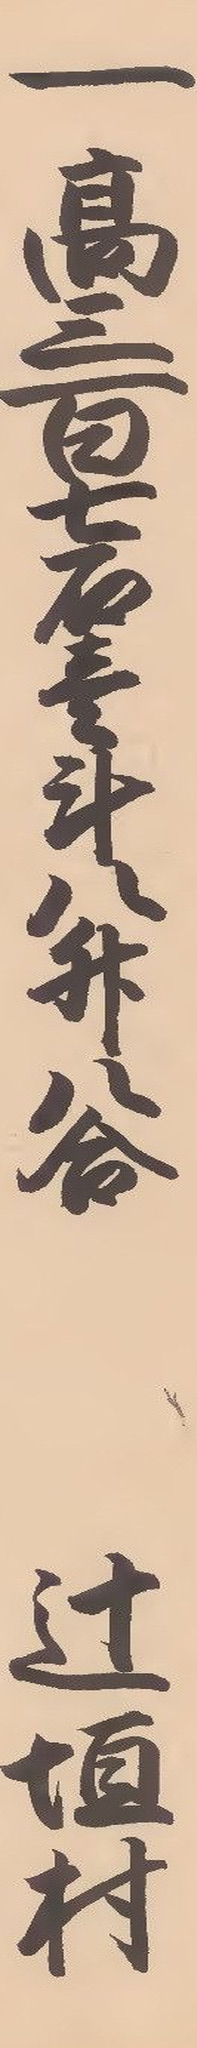一髙三百七石壱斗八升八合辻垣村
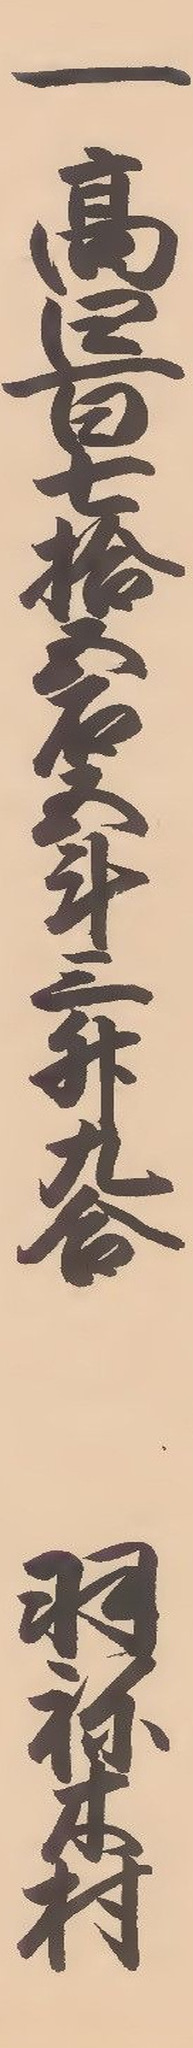一髙四百七拾五石五斗三升九合羽称木村
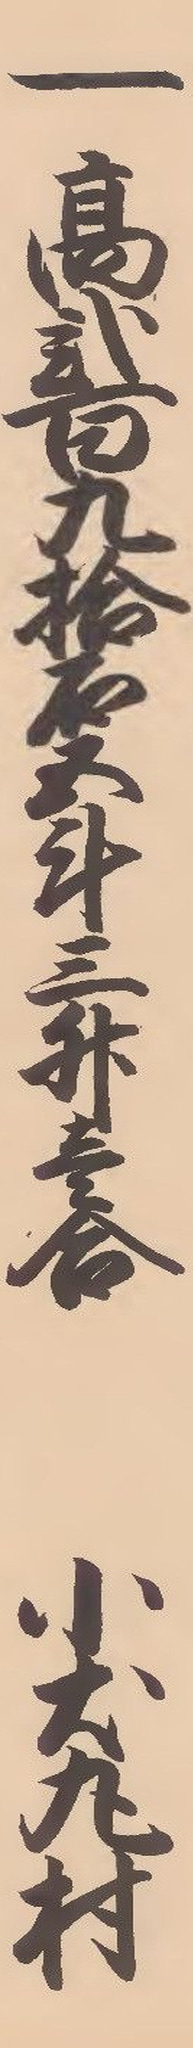一髙弐百九拾石五斗三升壱合小犬丸村
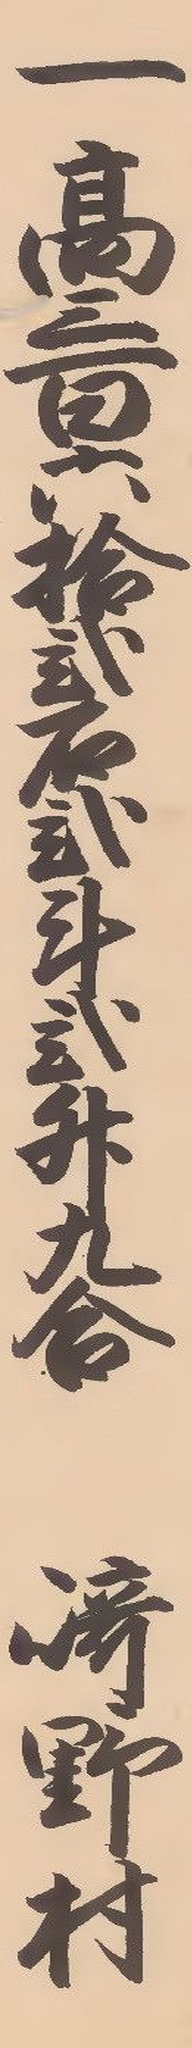一髙三百六拾弐石弐斗弐升九合崎野村
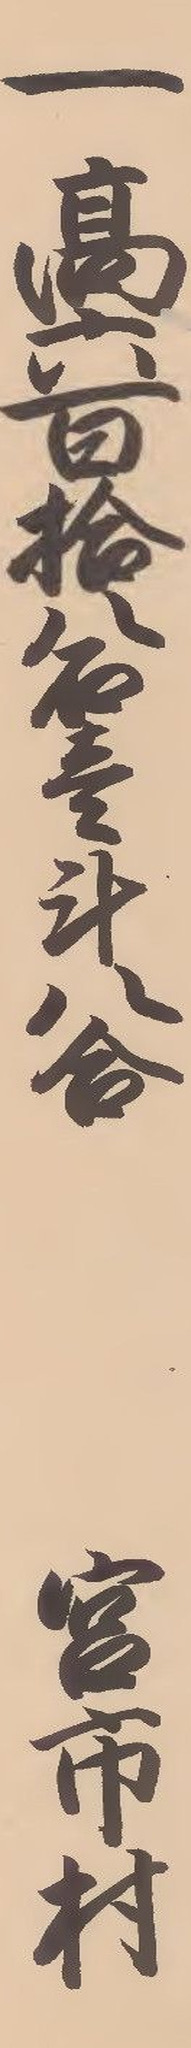一髙六百拾八石壱斗八合宮市村
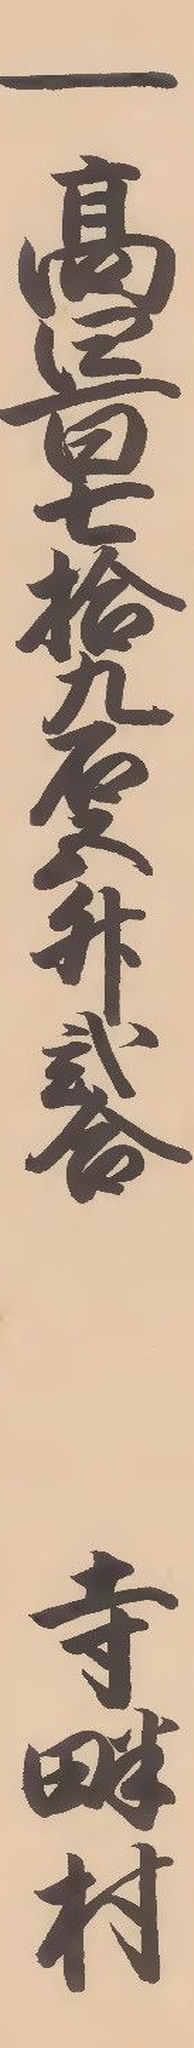一髙四百七拾九石五升弐合寺畔村
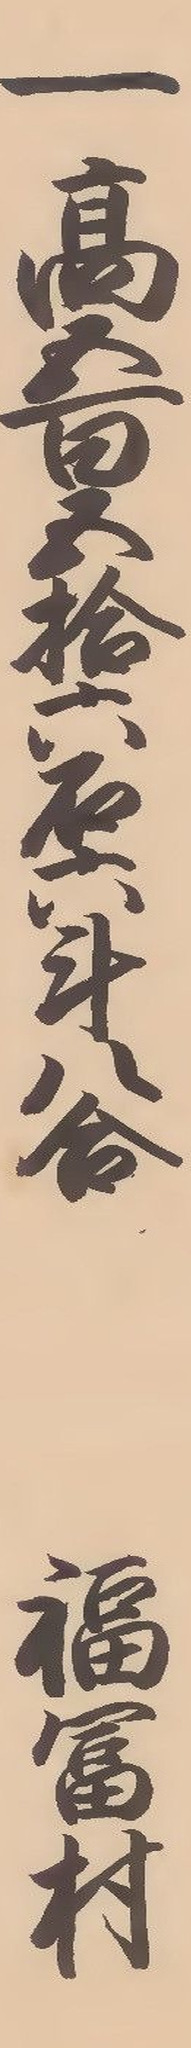一髙五百五拾六石六斗八合福冨村
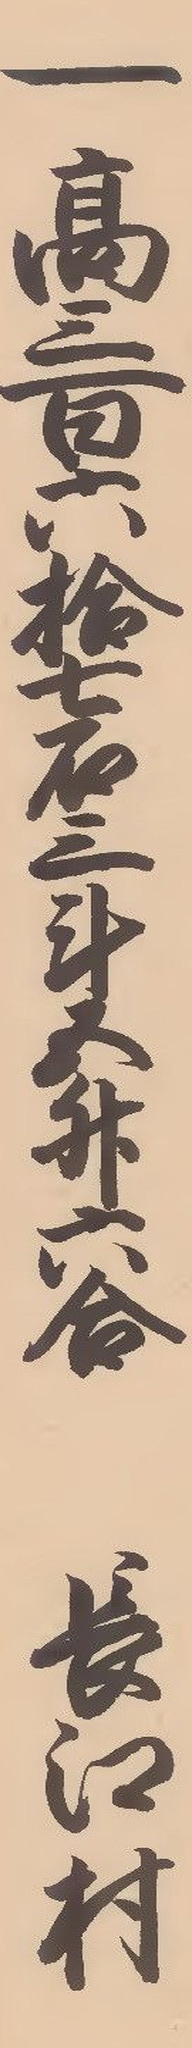一髙三百六拾七石三斗五升六合長江村

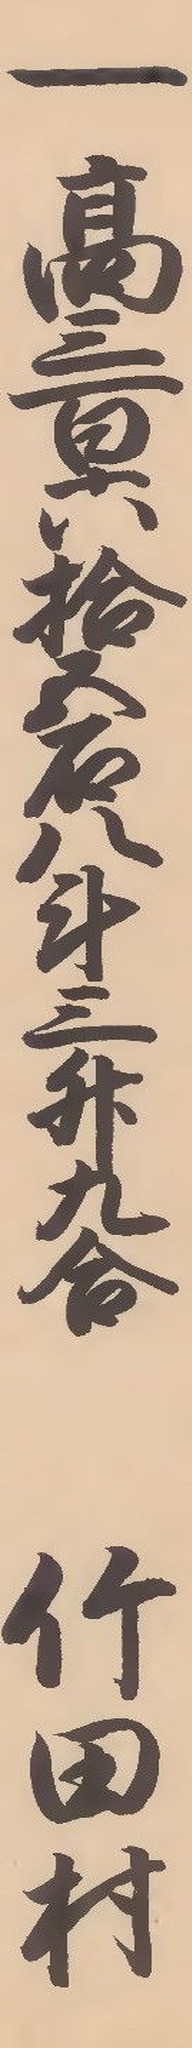一髙三百六拾五石八斗三升九合竹田村
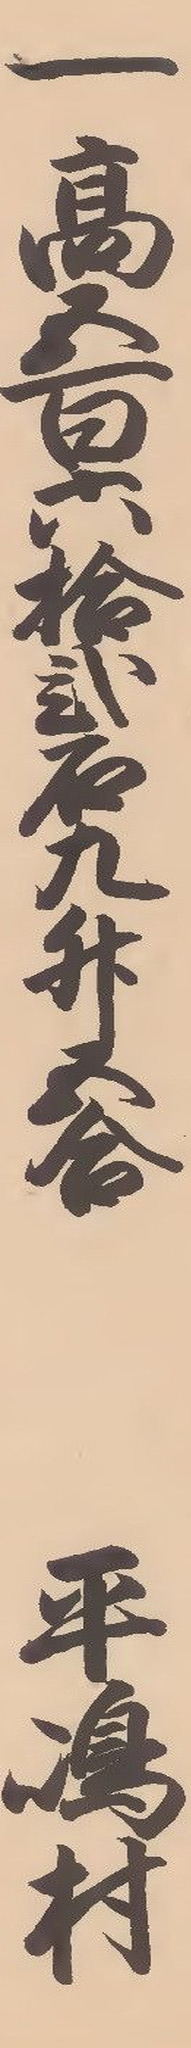一髙五百六拾弐石九升五合平嶋村
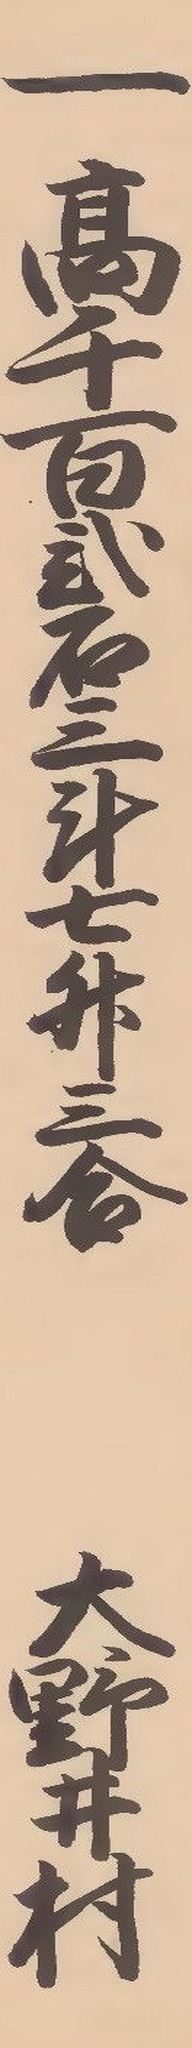一髙千百弐石三斗七升三合大野井村
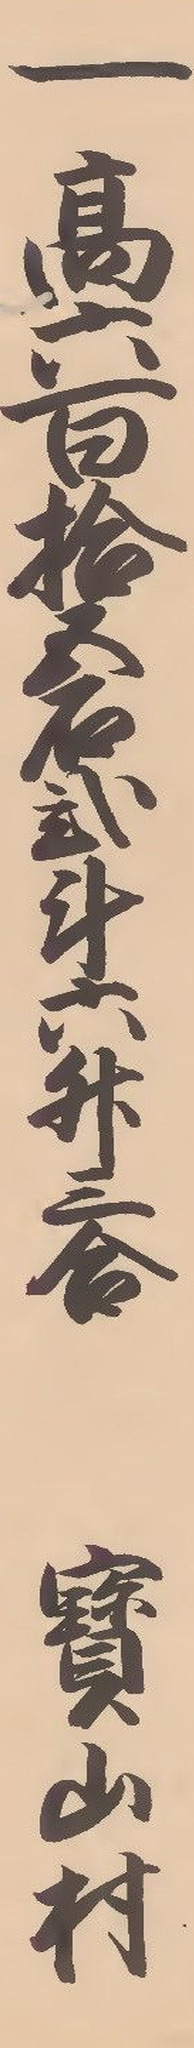一髙六百拾五石弐斗六升三合寶山村
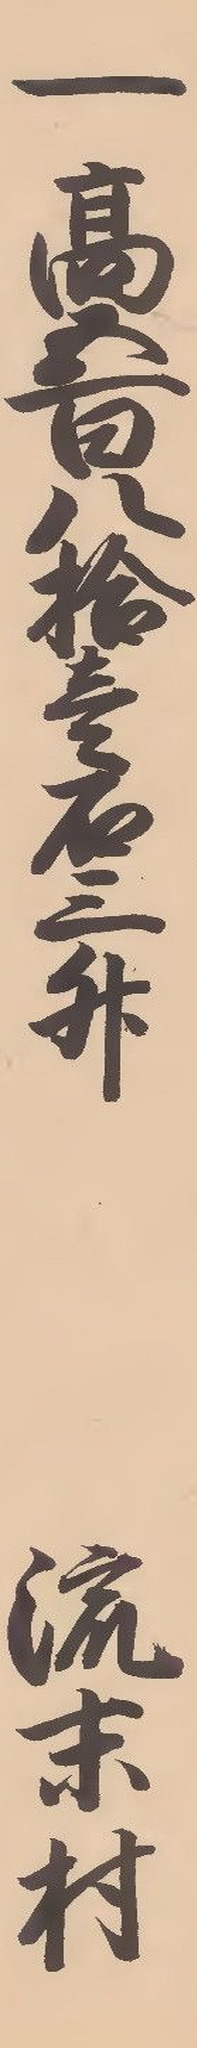一髙五百八拾壱石三升流末村
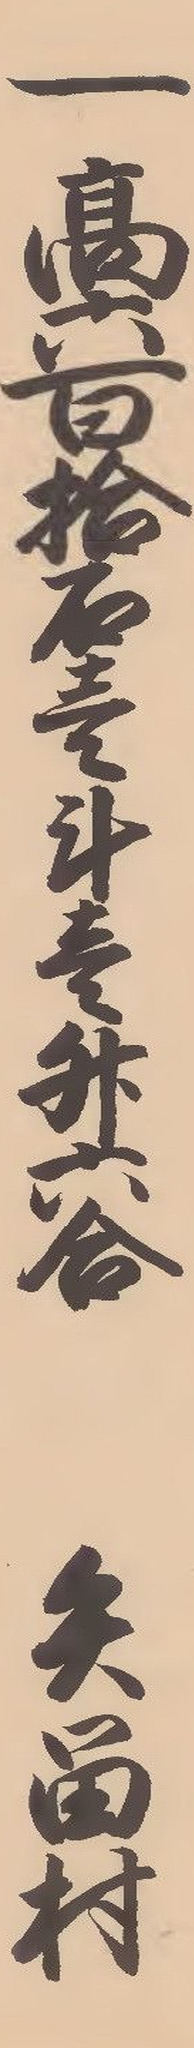一髙六百拾石壱斗壱升六合矢留村
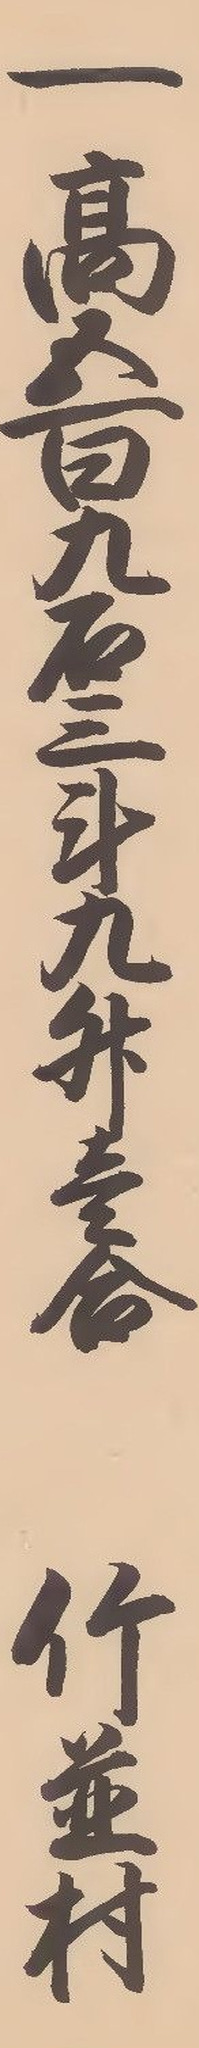一髙五百九石三斗九升壱合竹並村
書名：豊前国郷帳
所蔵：国立公文書館 National Archives of Japan
